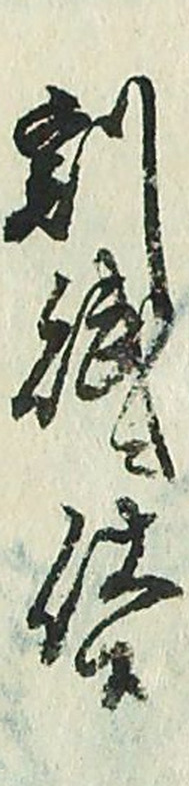割賦に仕候
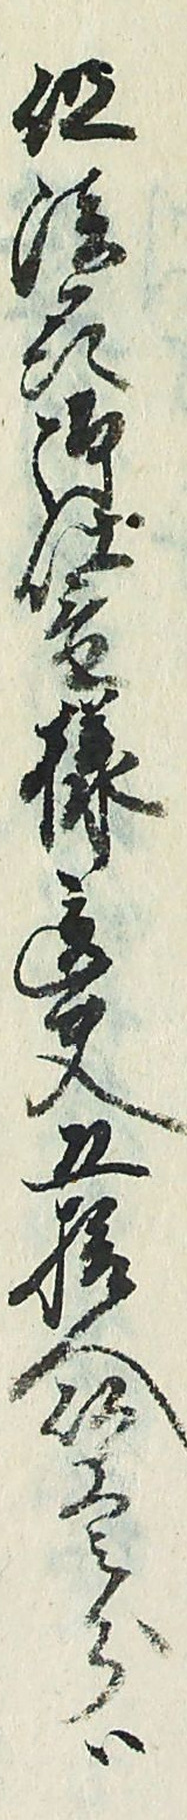但淡州御仕置様送夫五十人以上之分は
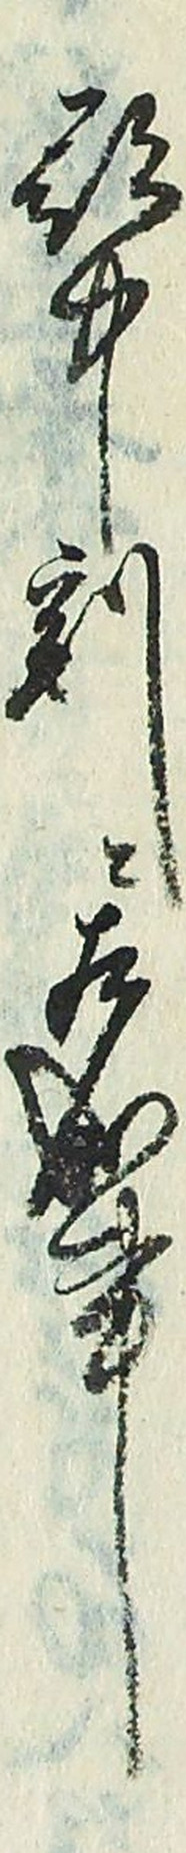郡中割と相成事
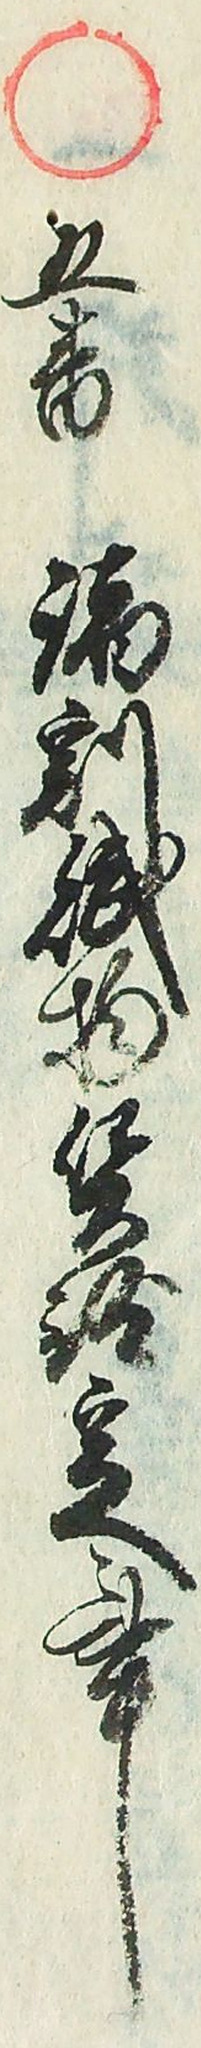五番諸割賦物賃銀定之事
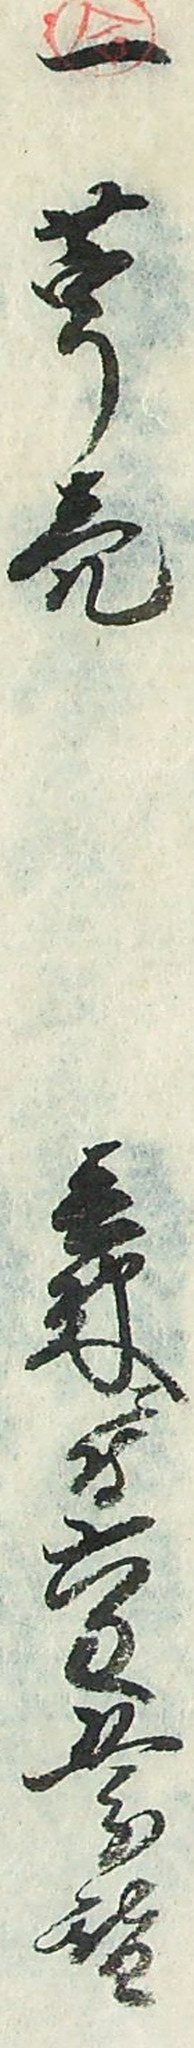一苧売一束に付六匁五分替

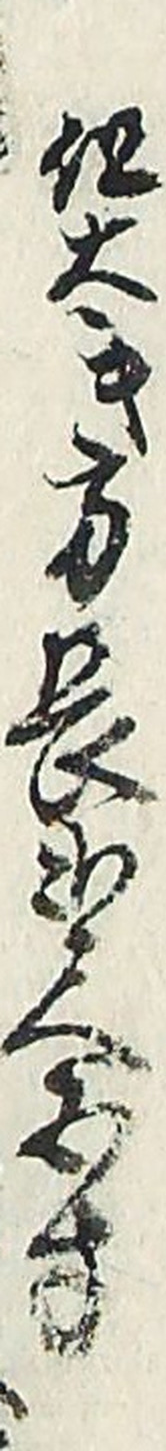但太き方長二尺五寸
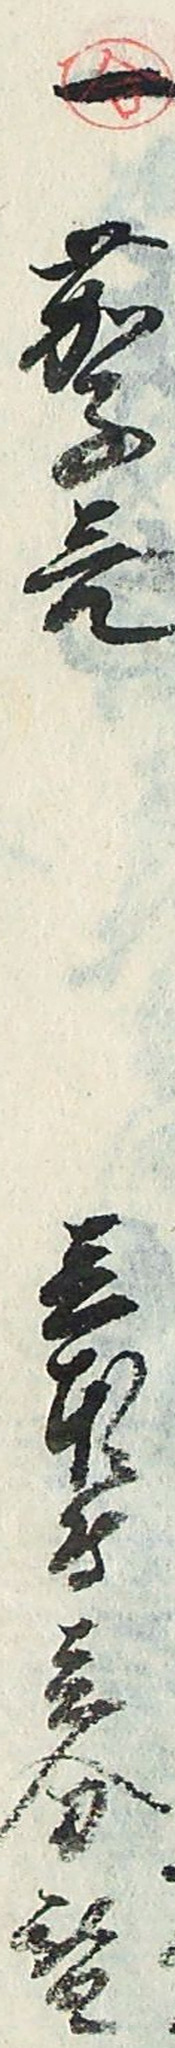一茄子売一本に付一分替
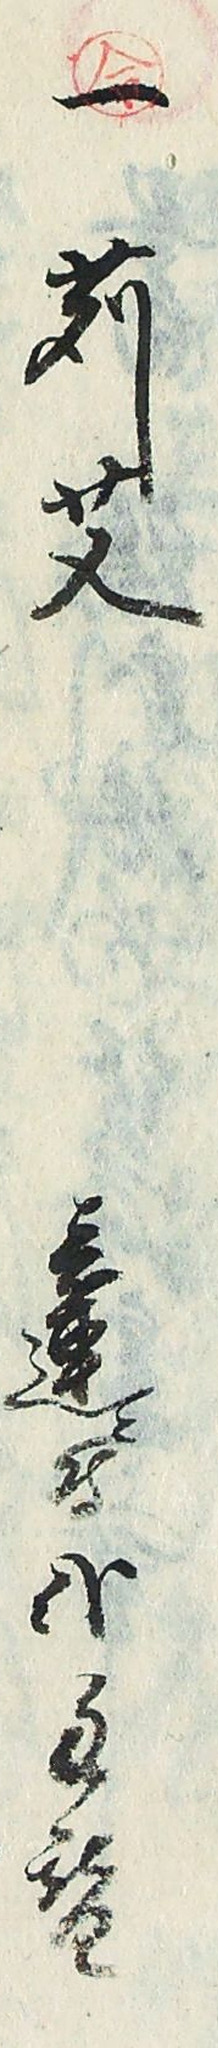一苅艾一連に付二匁替
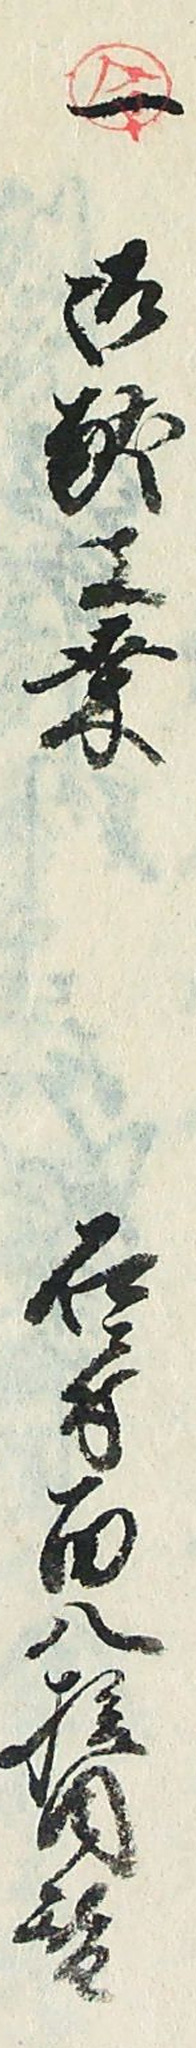一御献上桑石に付百八十目替
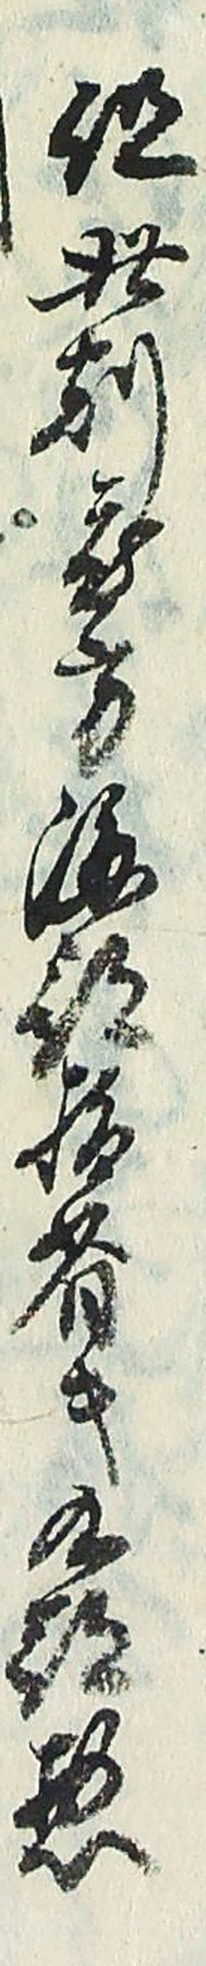但此割符方海部指省き九郡惣
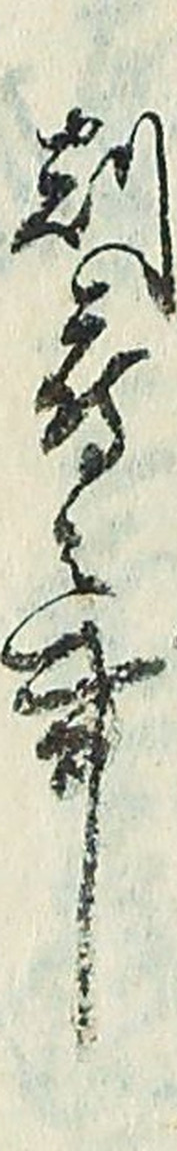割符之事
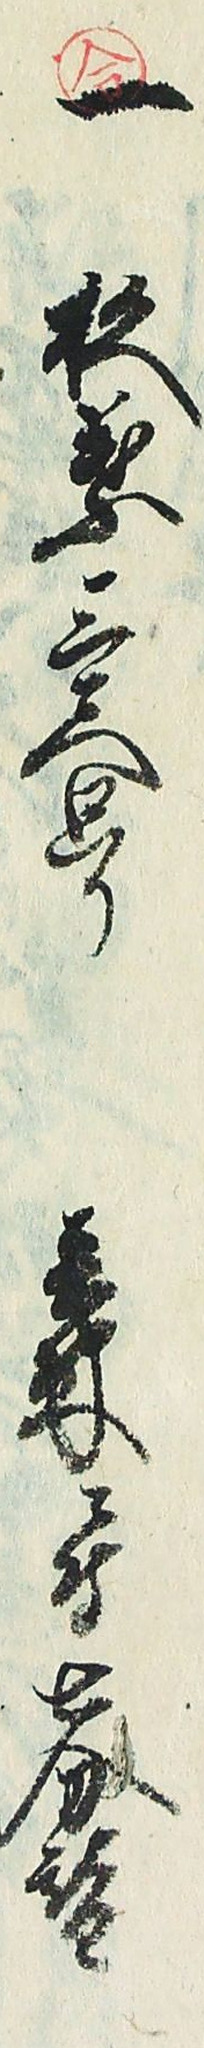一杉葉三尺廻り一束に付七分替
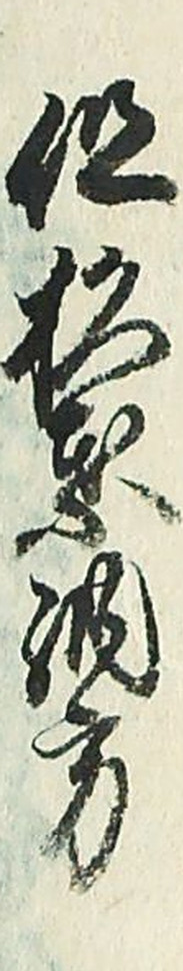但杉葉納方
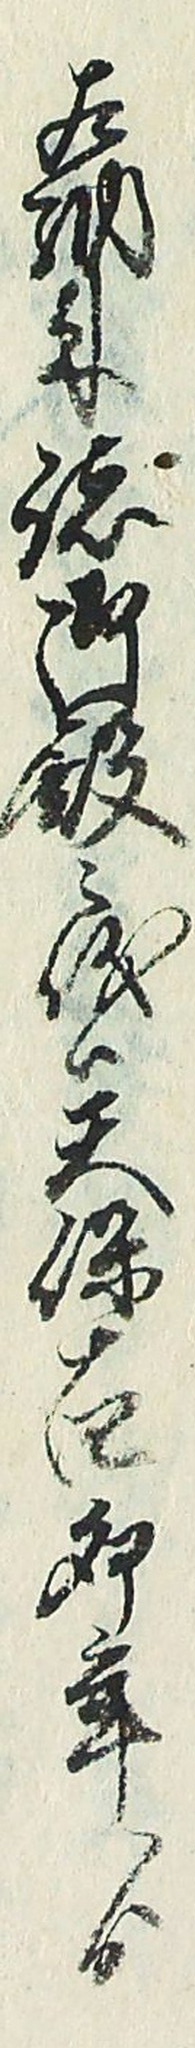相納来諸御殿之儀は天保十四卯年より
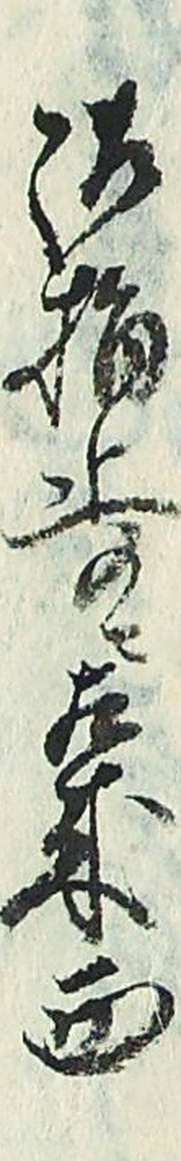御指止給めに相成西
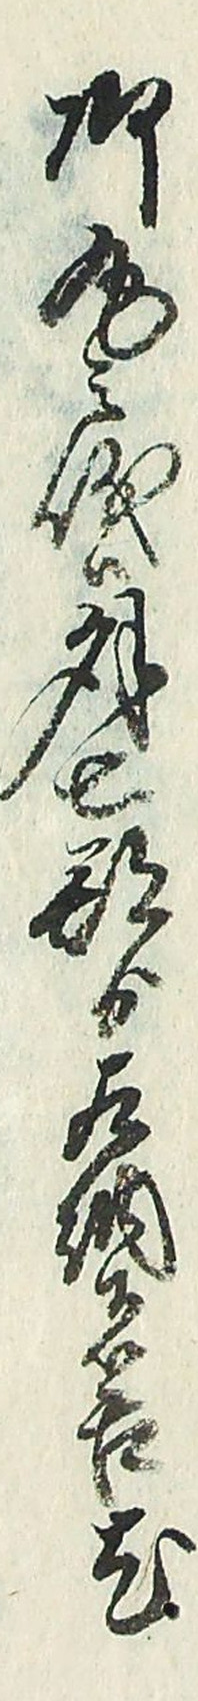御丸之儀は外七郡より相納候筈尤
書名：諸割賦物賃銀定記録帳
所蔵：鳴門教育大学 Naruto University of Education
